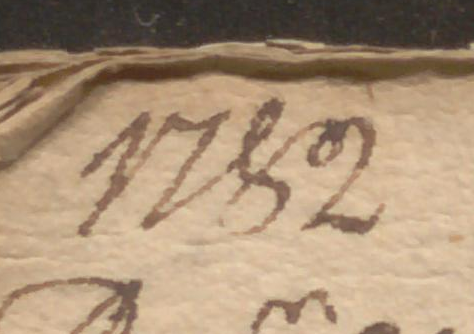1782
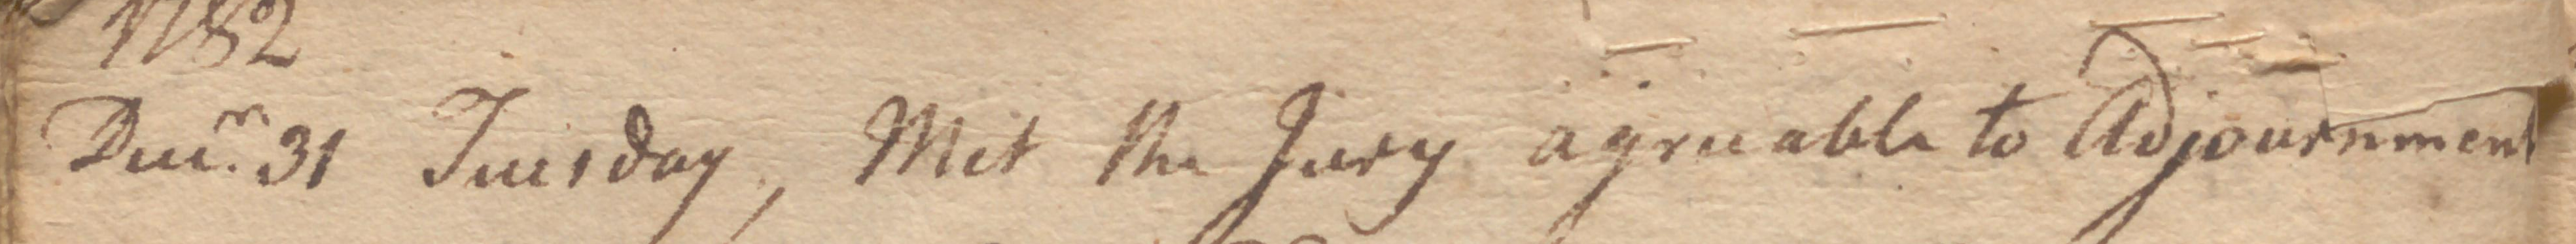Dec^r. 31 Tuesday, Met the Jury agreeable to Adjournment
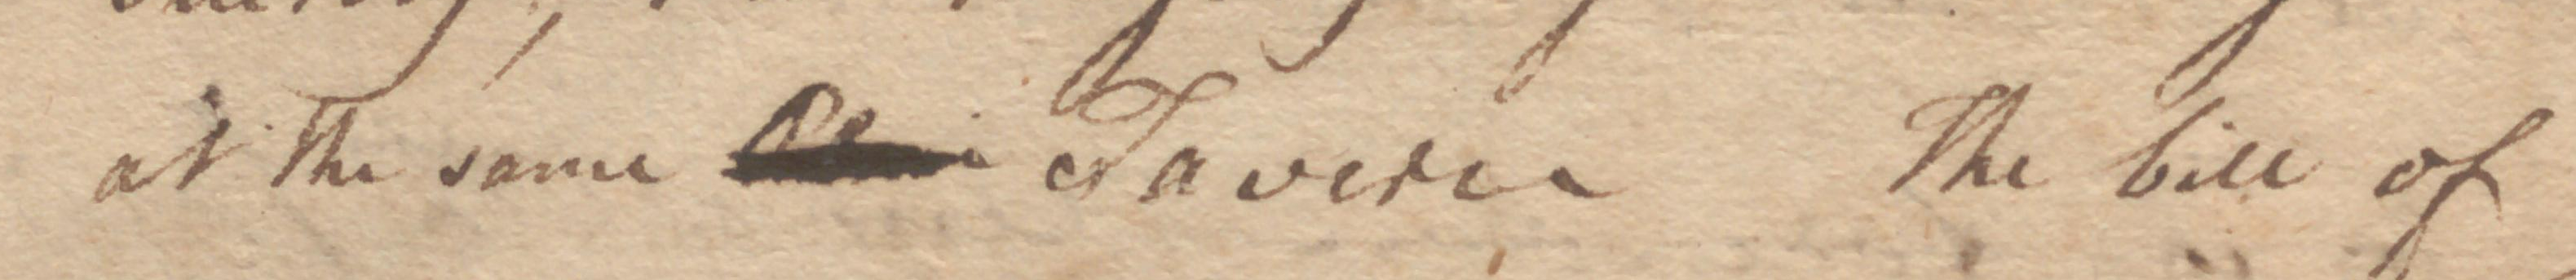at the same [Place] Tavere- The bill of
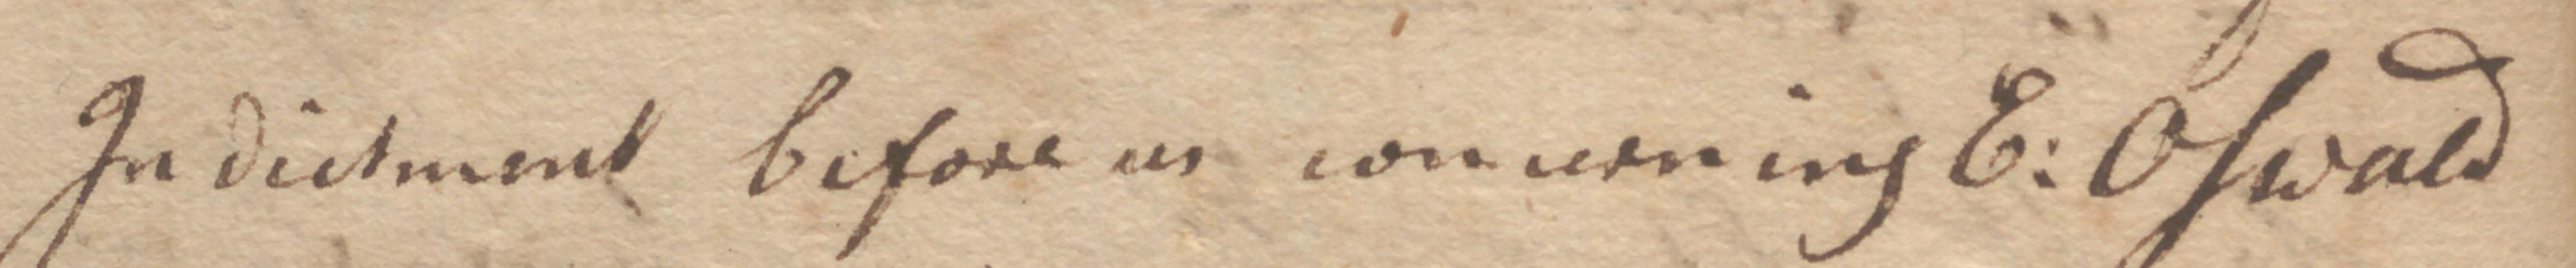Indictment before us concerning E: Oswald
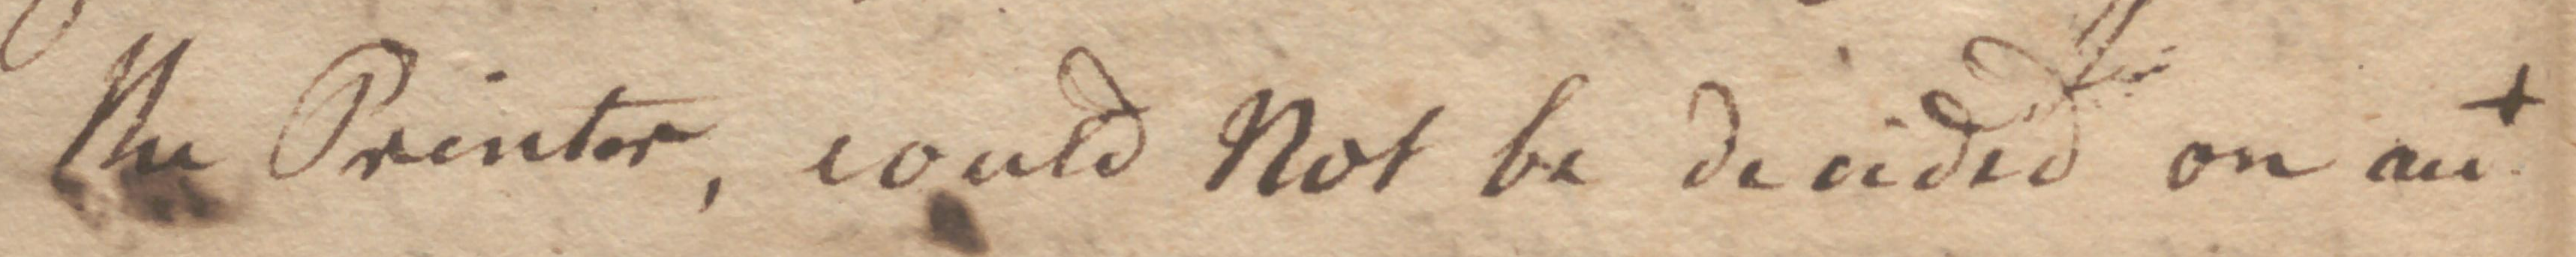the Printer, could not be decided on acc^t
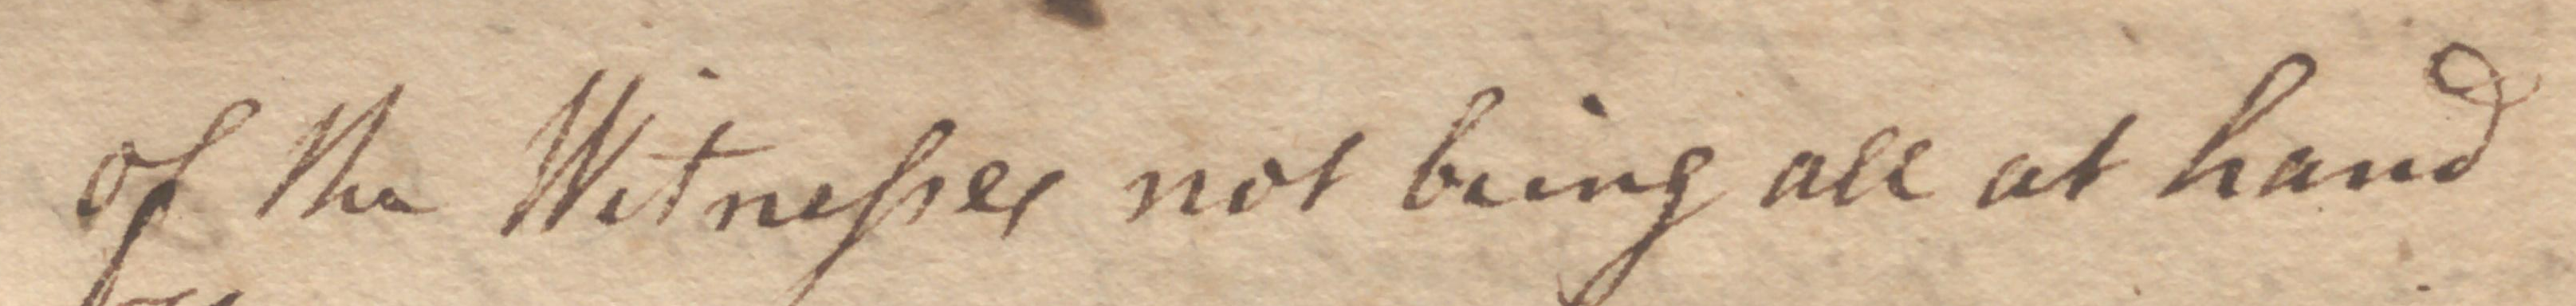of the Witnesses not being all at hand
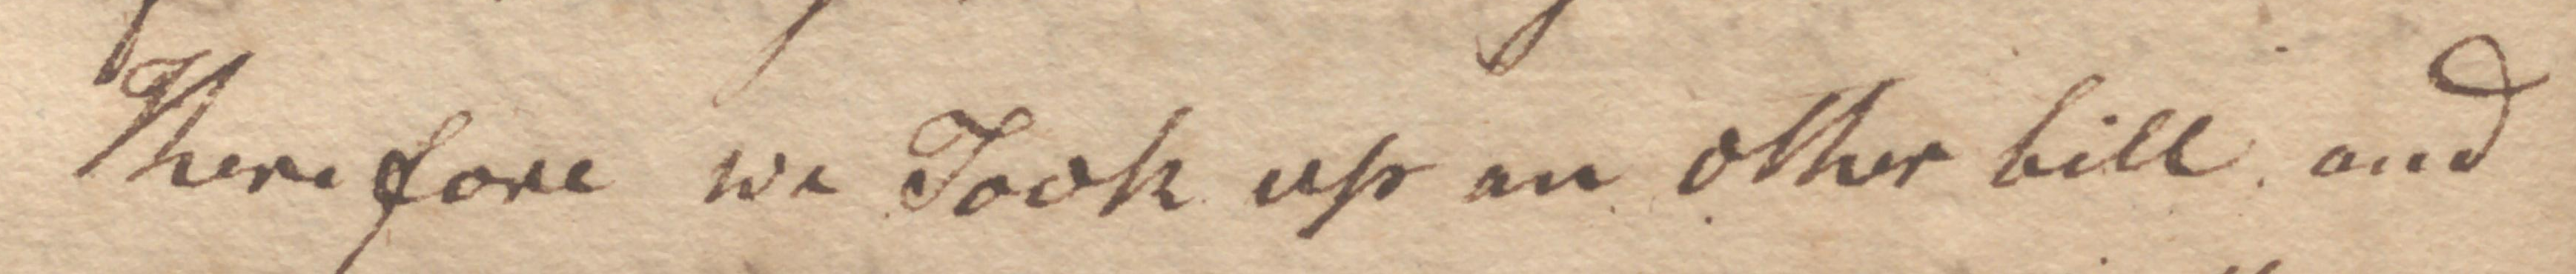Therefore we Took up an other bill and
